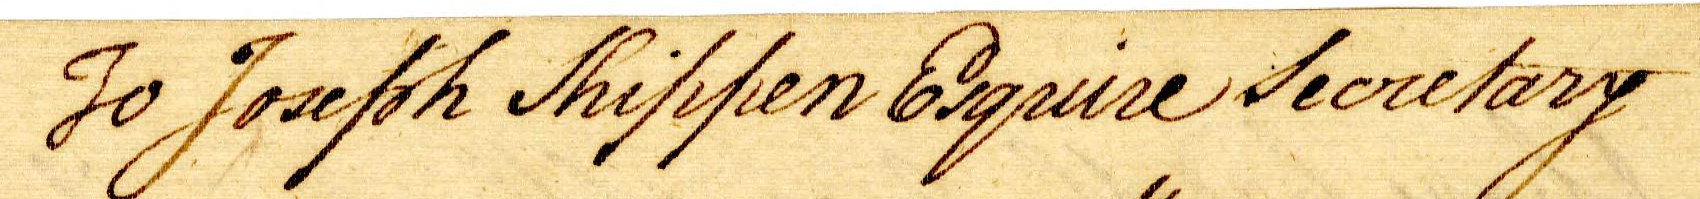To Joseph Shippen Esquire Secretary
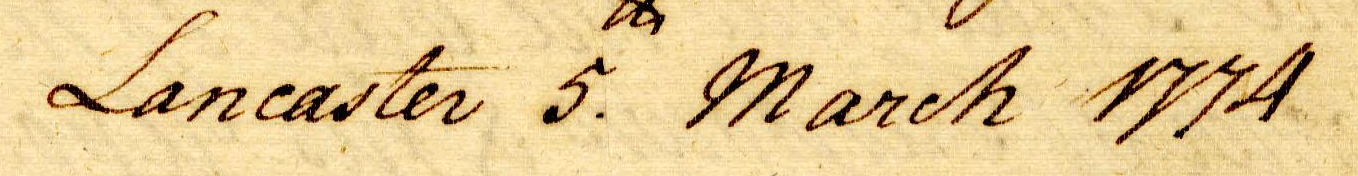Lancaster 5^th. March 1774
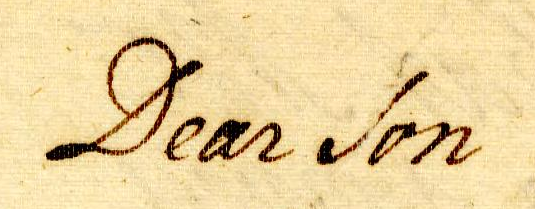Dear Son
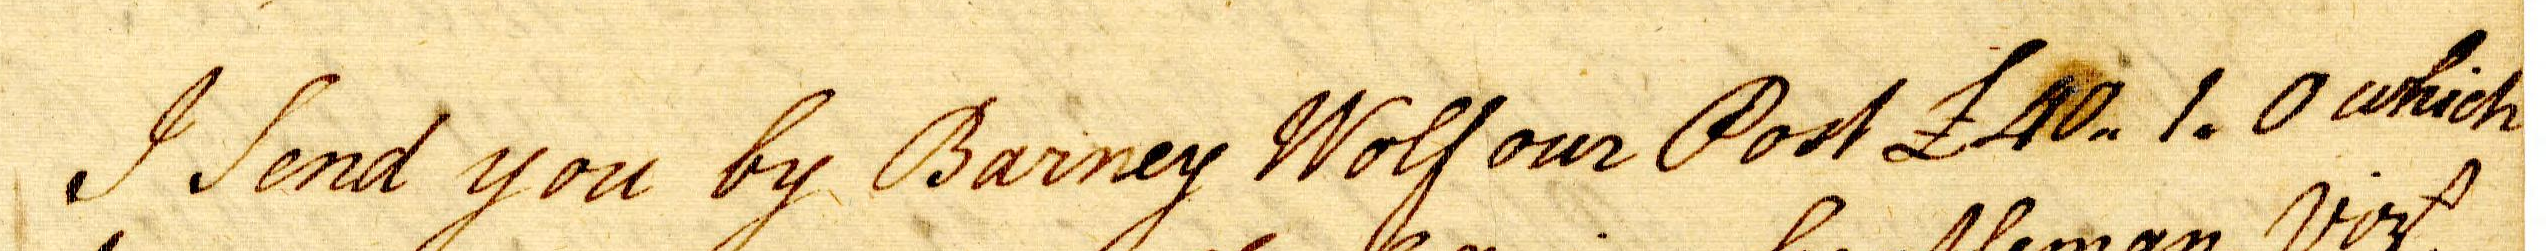I Send you by Barney Wolf our Post £40..1.0 which
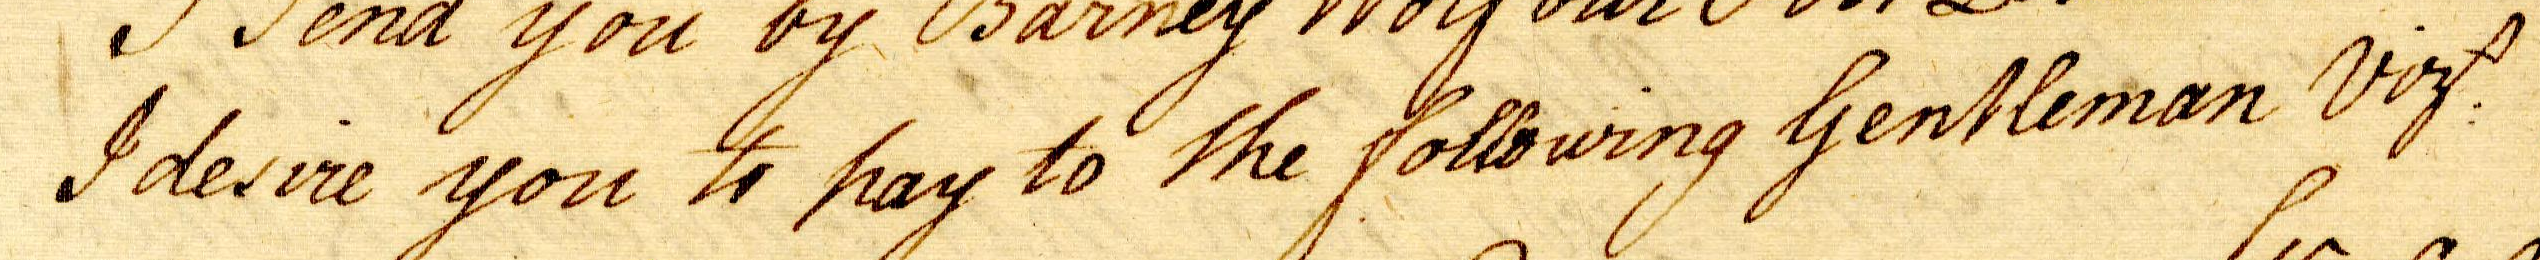I desire you to pay to the following Gentleman Viz^t.
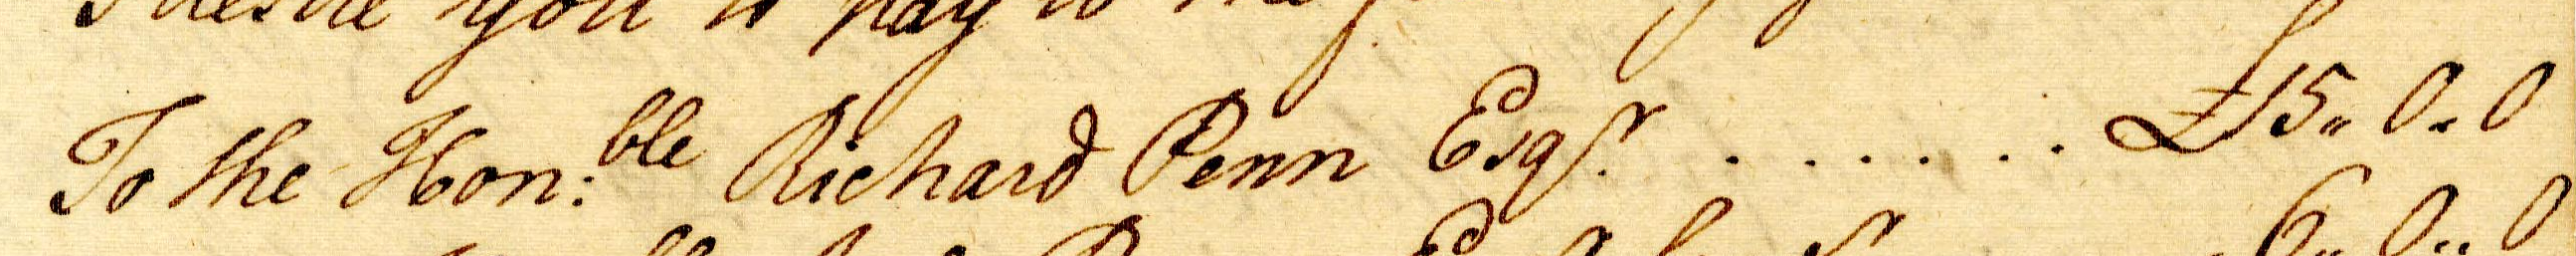To the Hon:^ble Richard Penn Esq^r. ...... £15..0..0
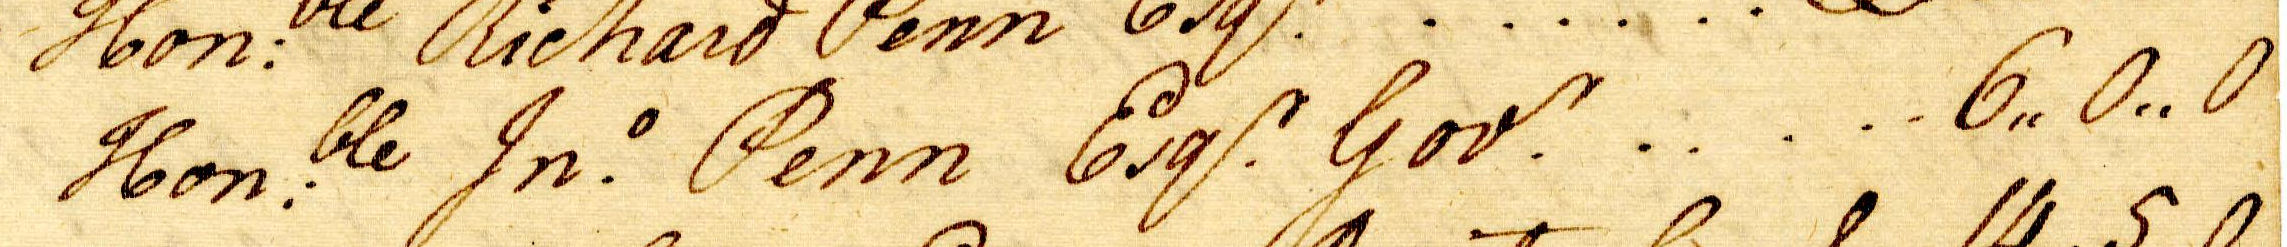Hon^ble: Jn^o. Penn Esq^r. Gov^r. ..... 6..0..0
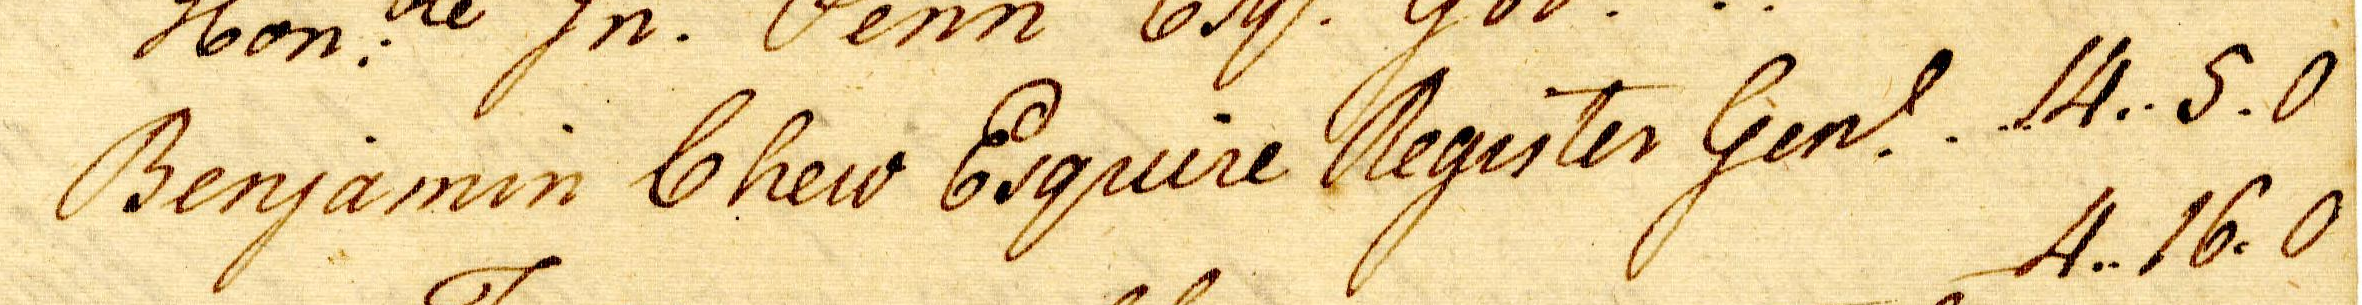Benjamin Chew Esquire Register Gen^l... 14.. 5.0
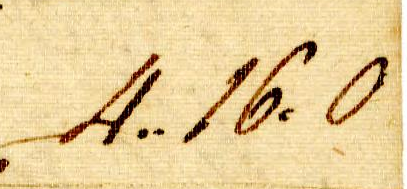4..16.0
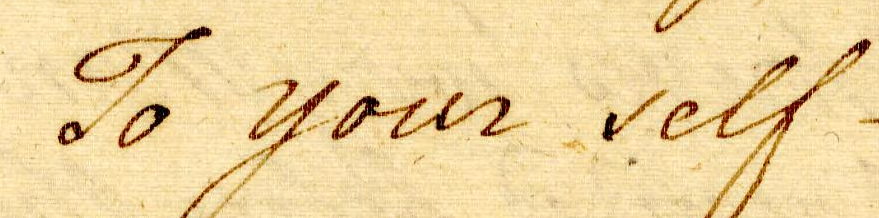To your self-
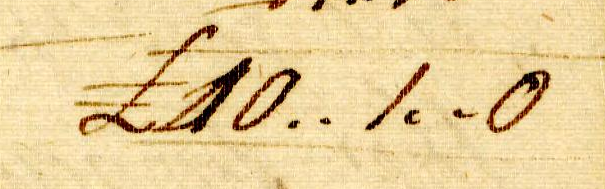£10..1..0
